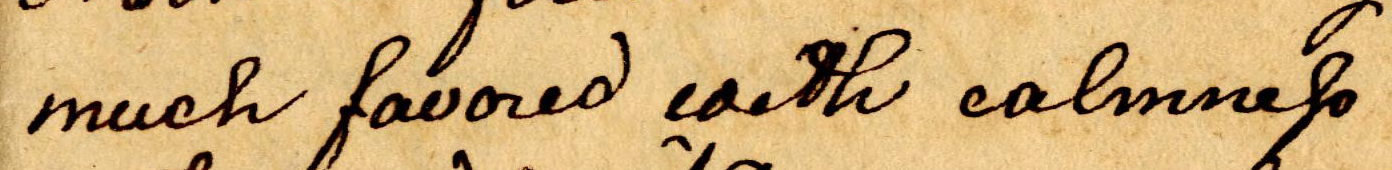much favored with calmness
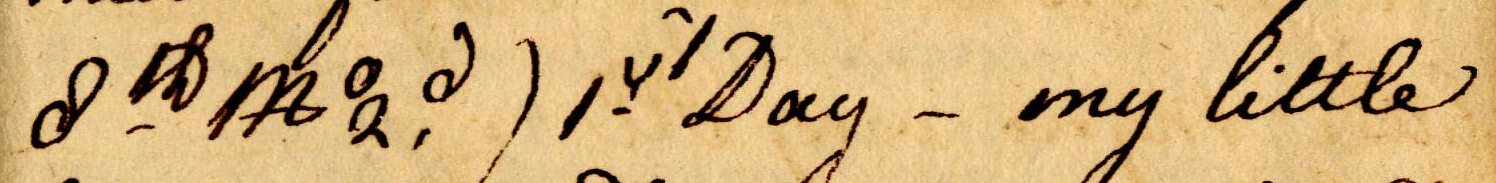8^th M^o 2^d) 1^st Day- my little
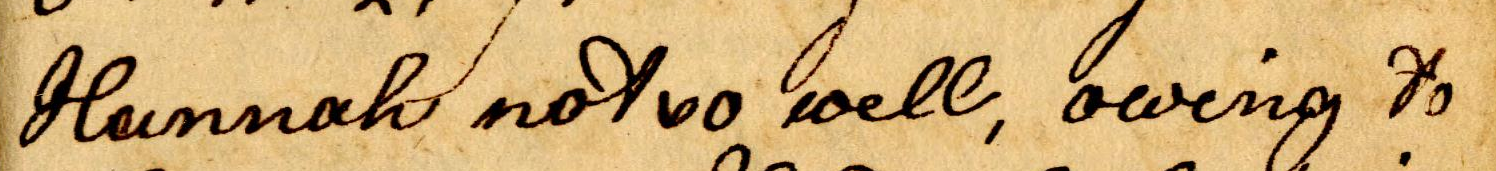Hannah not so well, owing to
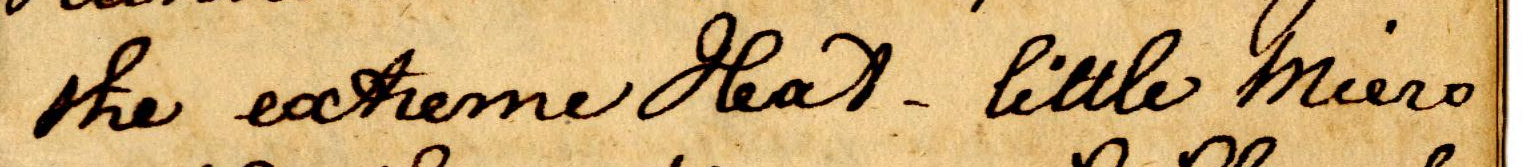the extreme Heat- little Miers
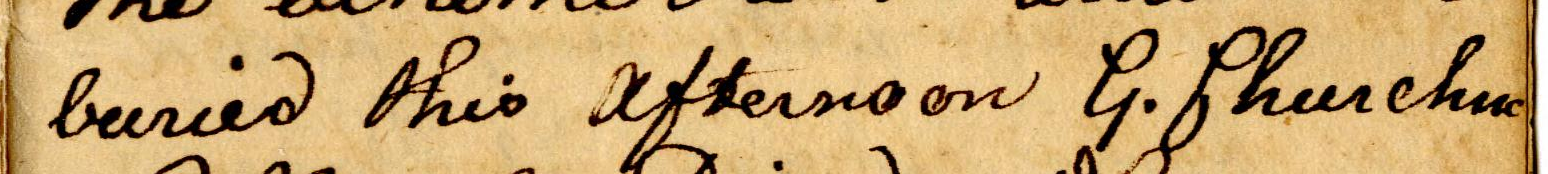buried this Afternoon G. Churchm
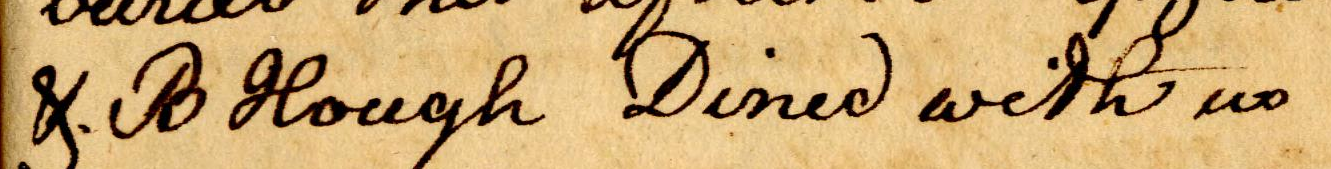& B Hough Dined with us
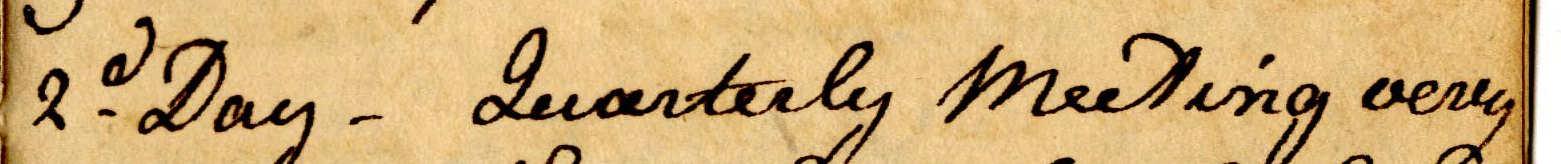2^d Day- Quarterly Meeting very
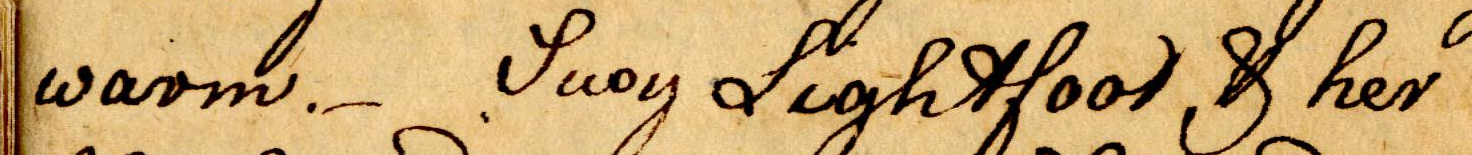warm.- Susy Lightfoot, & her
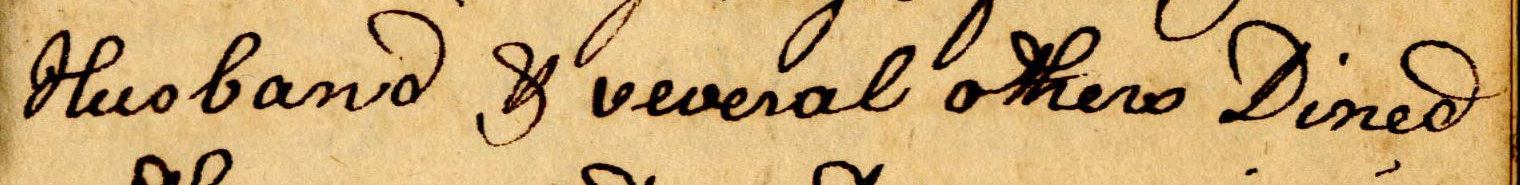Husband & several others Dined
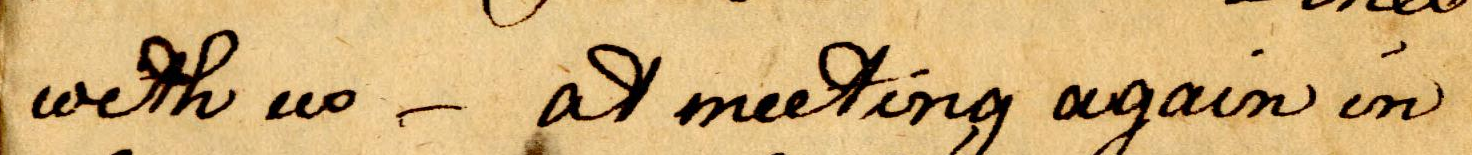with us- at meeting again in
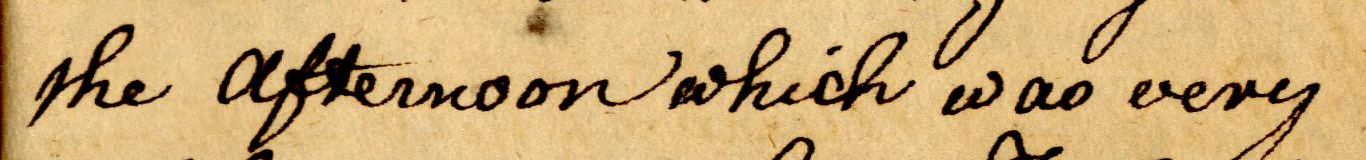the Afternoon which was very
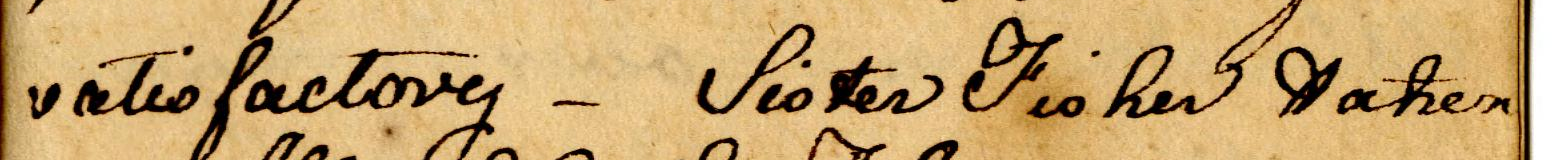satisfactory- Sister Fisher, taken
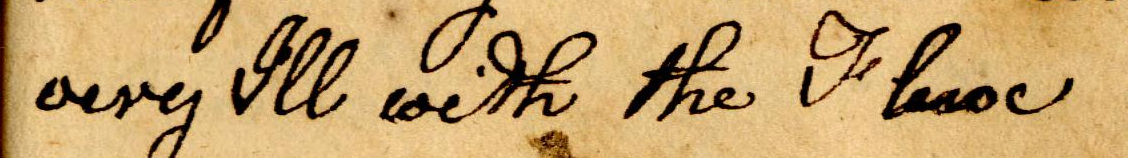very Ill with the Flux
